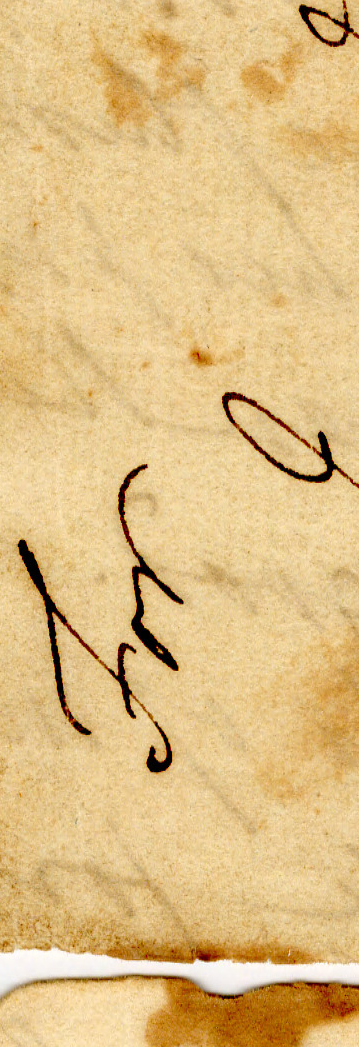For
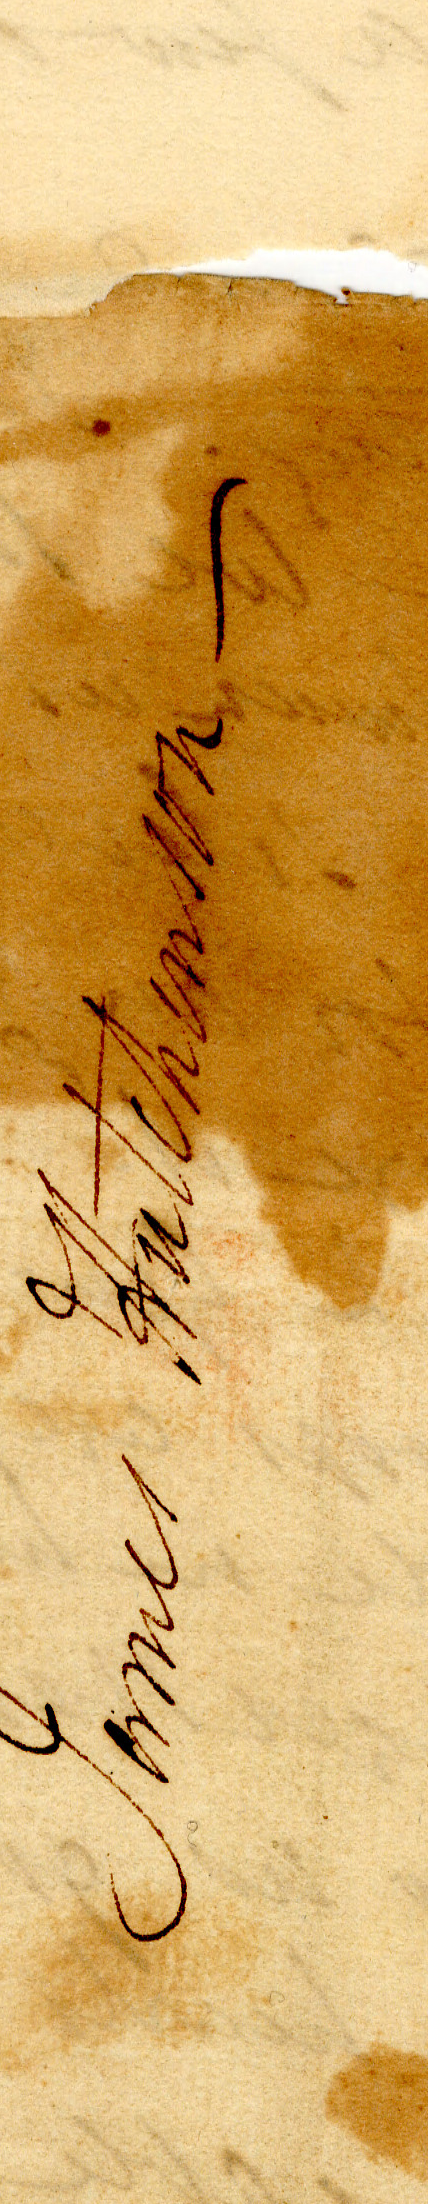James Hutchinson-
